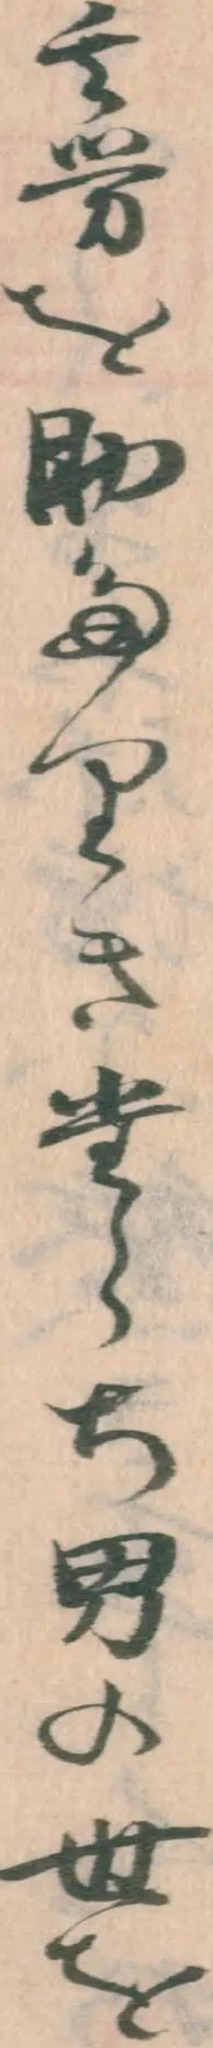其労を助たりきたゝち男の世を
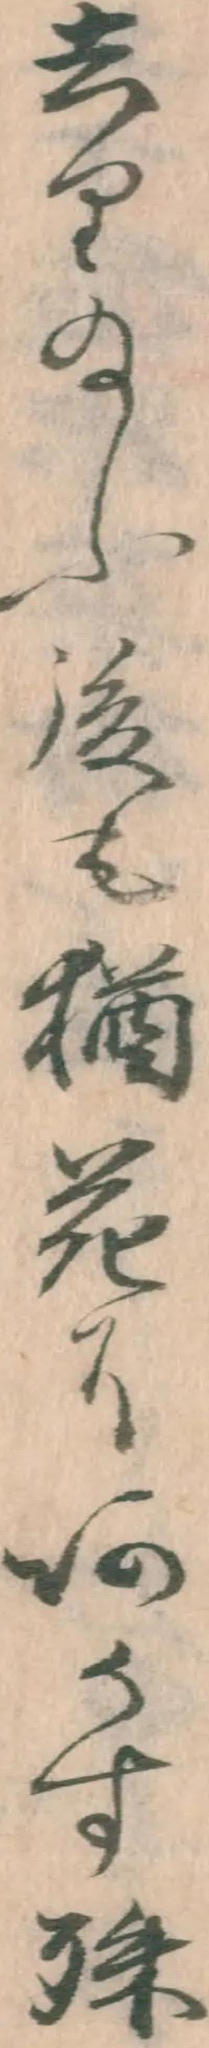去り給ふ後も猶花にあかす殊
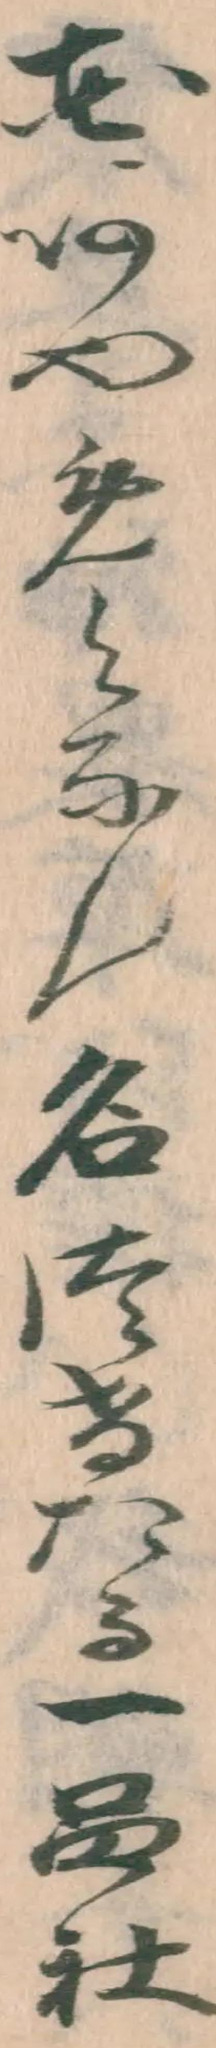花あやめとなん名つけたる一品社
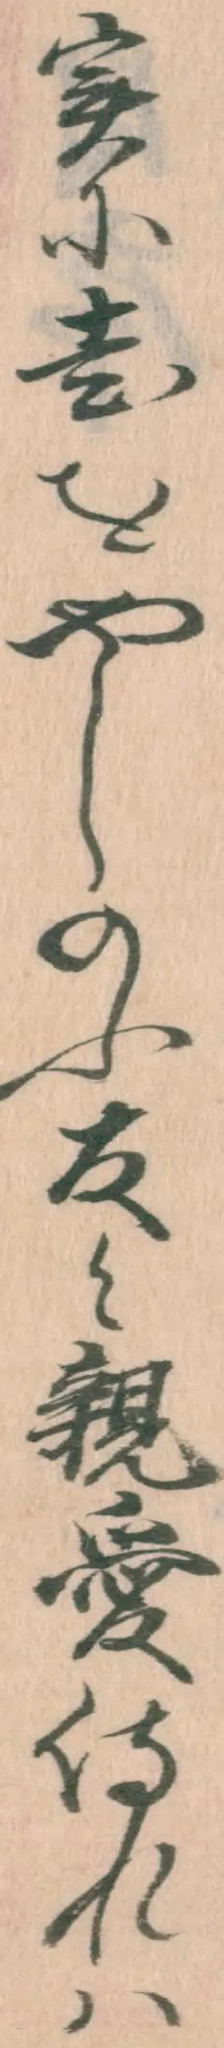実に芸をやしのふ友と親愛侍れは
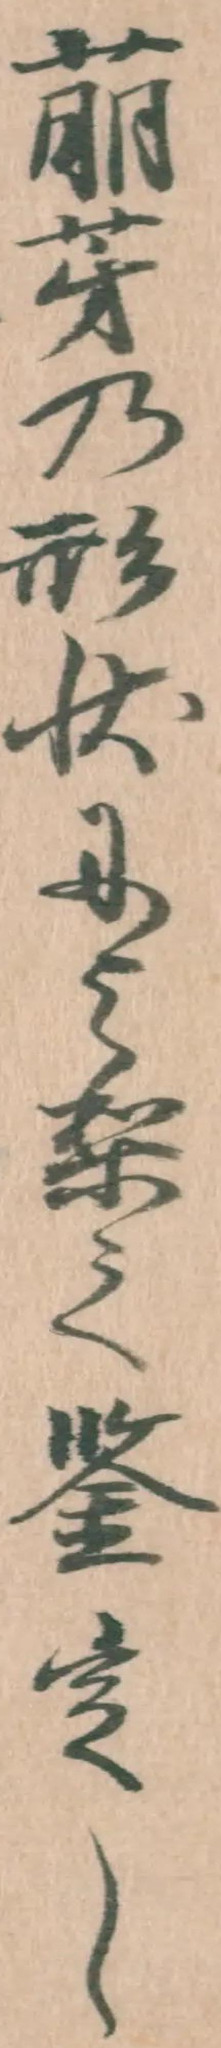萌芽の形状には架て筌定し
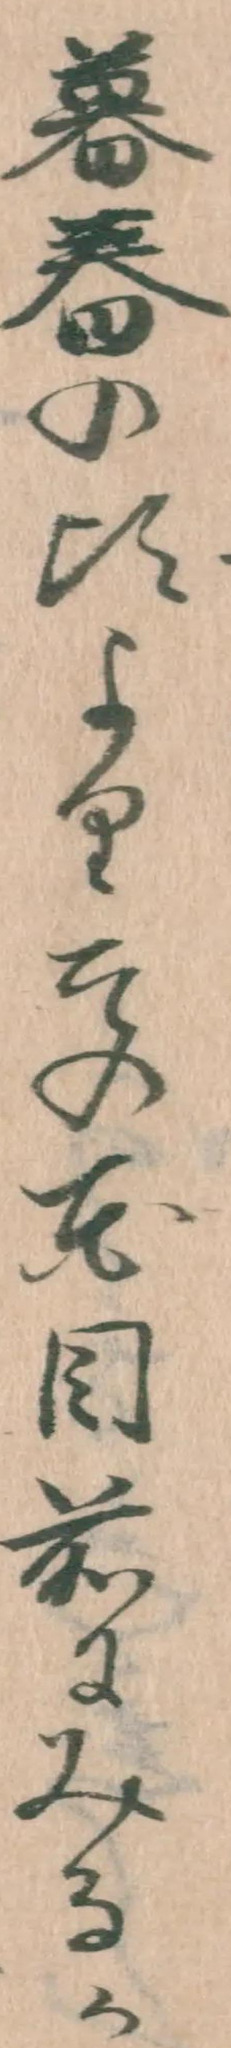暮春の頃よりその花目前にみるか
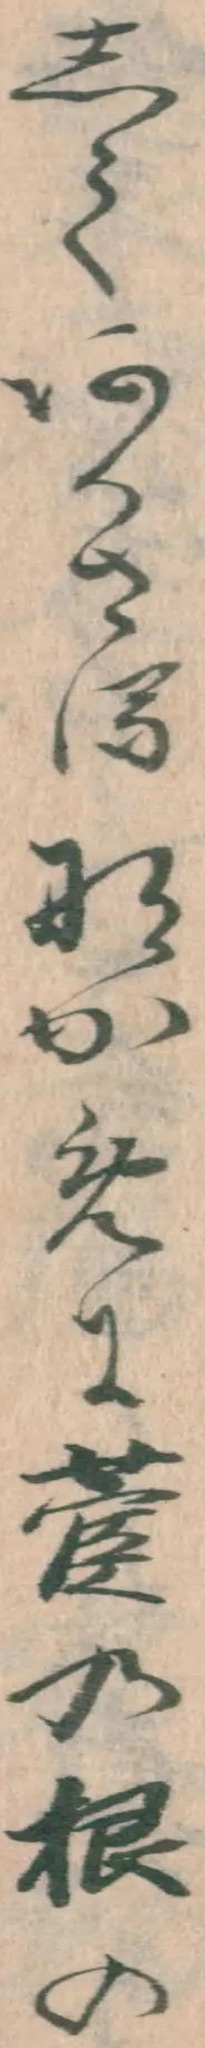してあかさるなか菅の根の
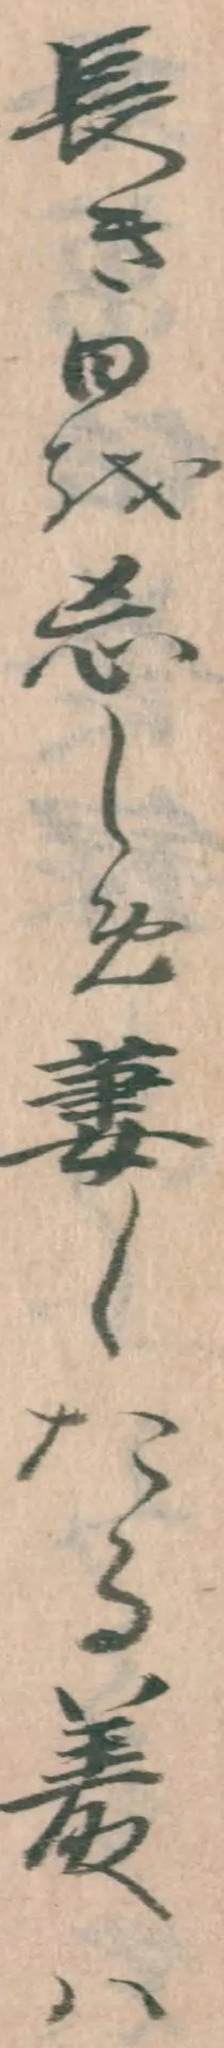長き目を忍しめ萋したる羨は
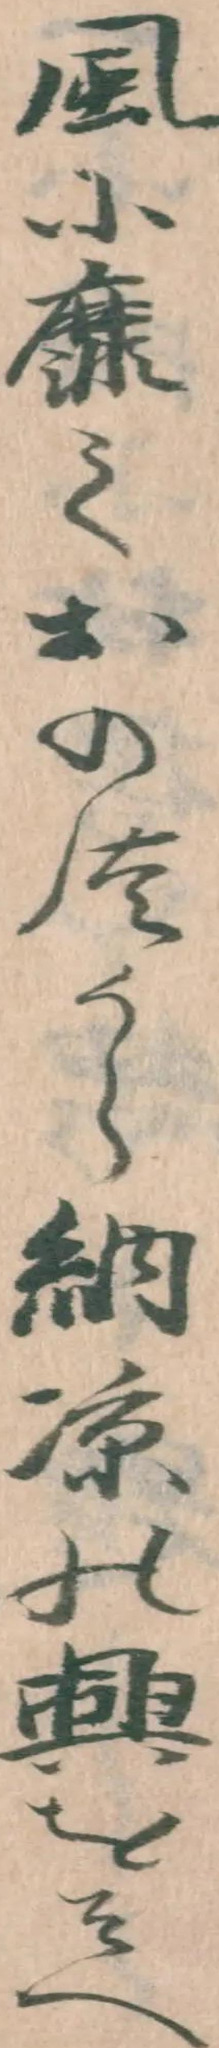風に靡ておのつから納涼の興をそへ
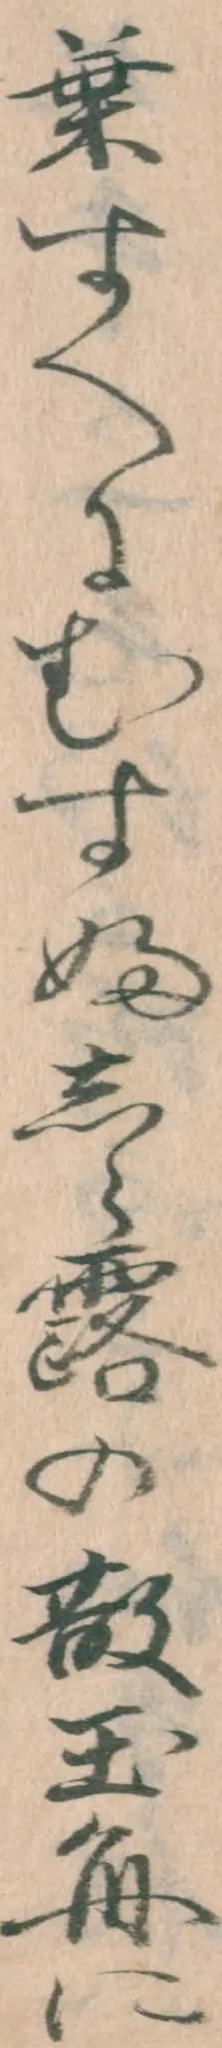葉生へにむすふしら露の散玉舟に
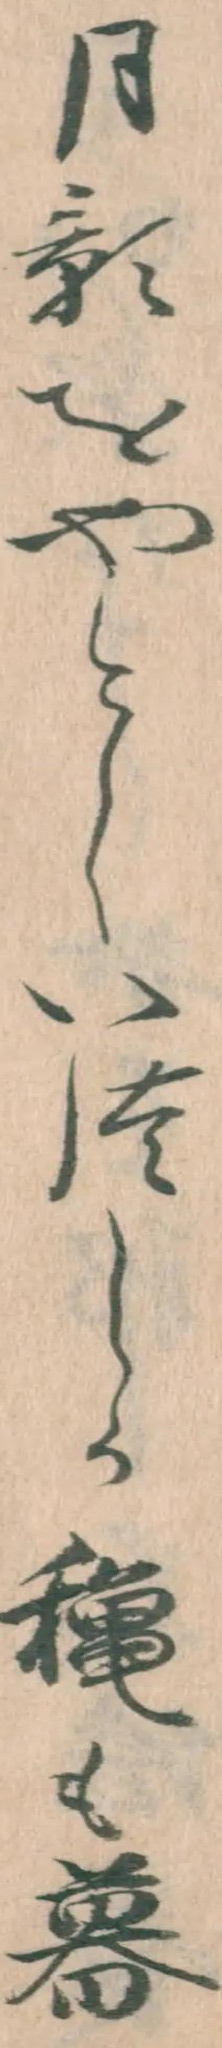月影をやとしいつしか秋も暮
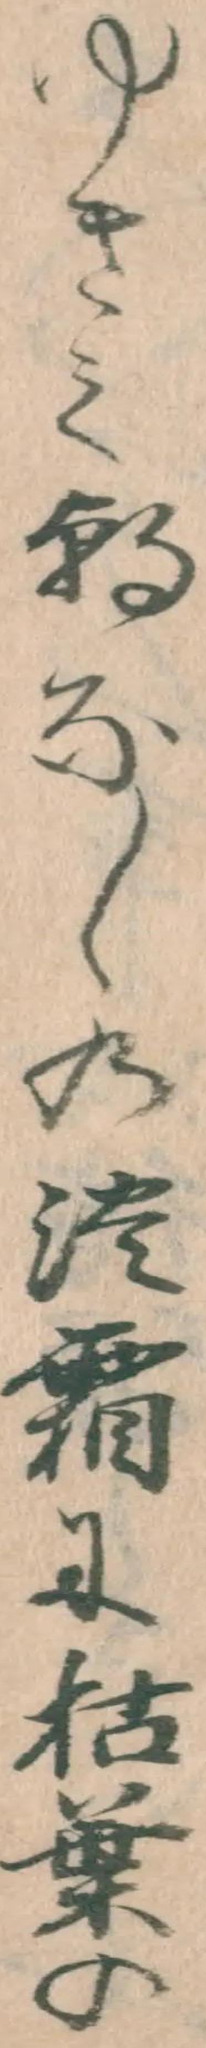ゆきて朝早くの淡霜に枯葉の
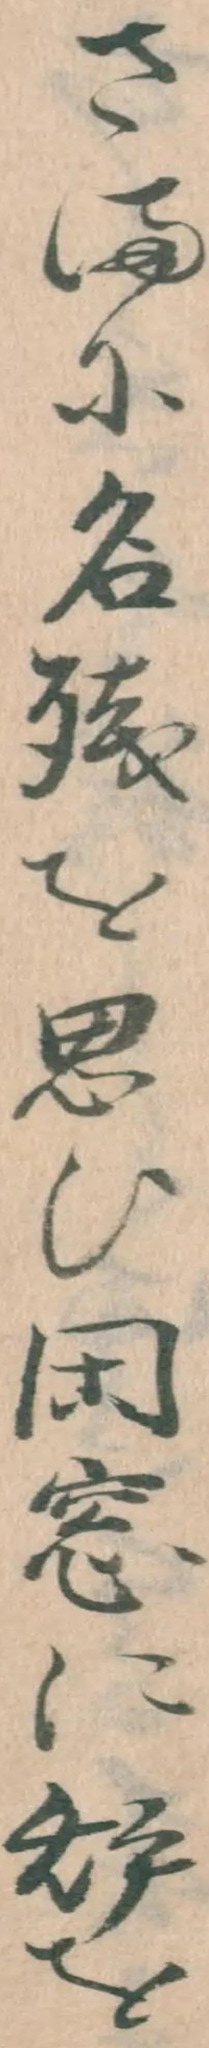さまに名残を思ひ固窓に炉を

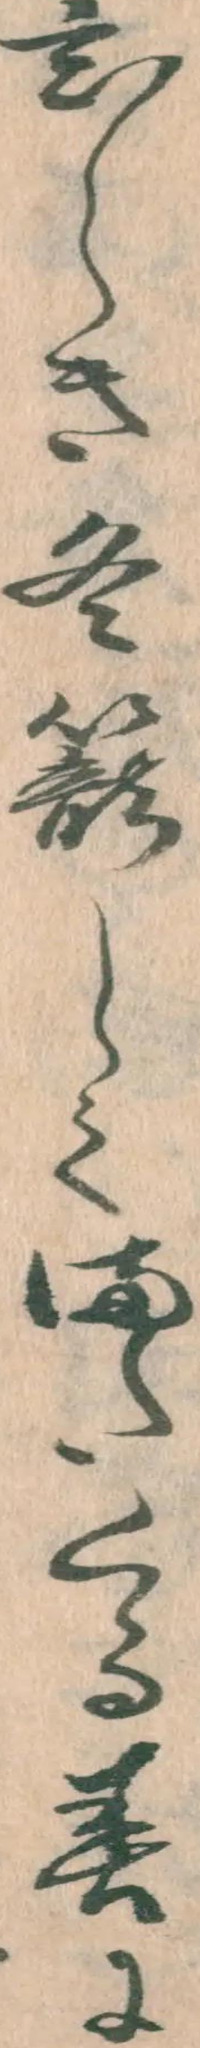ひらき冬籠してまたくる春に
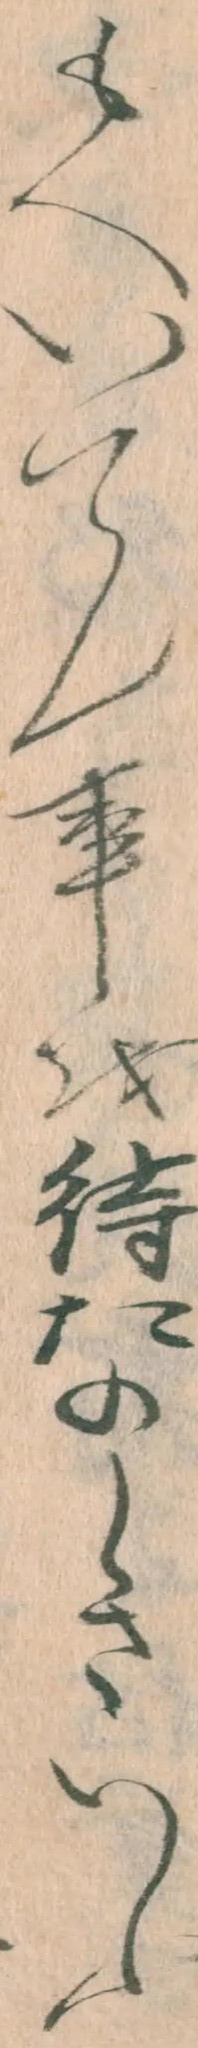もへいてん事を待たのしさいふ
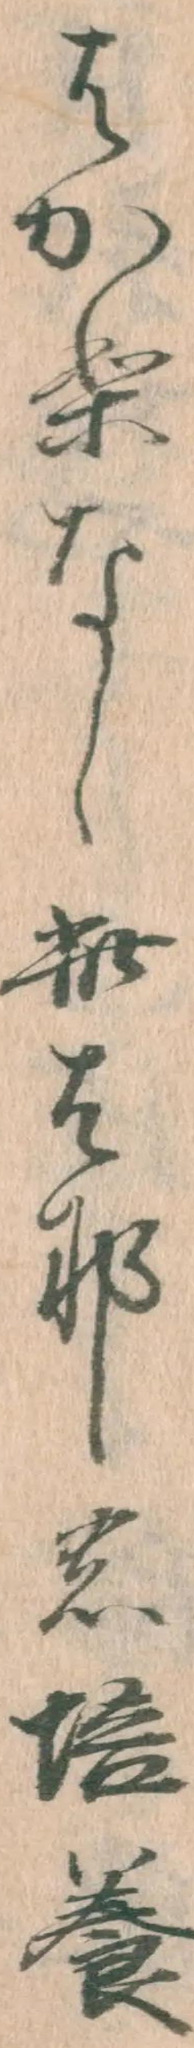はかりなし此はなの培養
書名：花菖培養録
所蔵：国立国会図書館 National Diet Library, JAPAN
